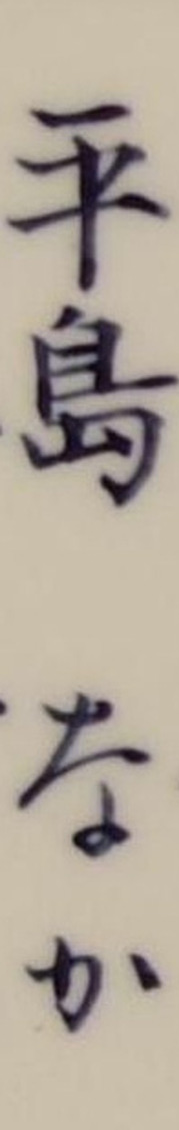平島なか
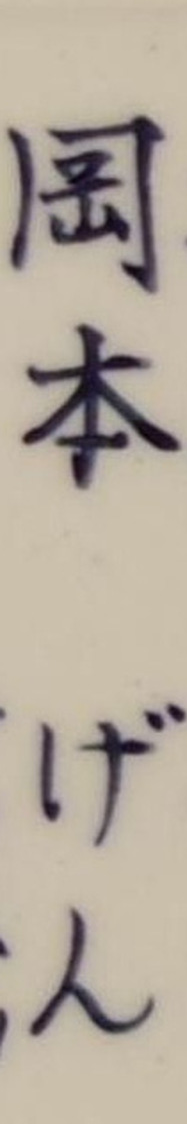岡本げん

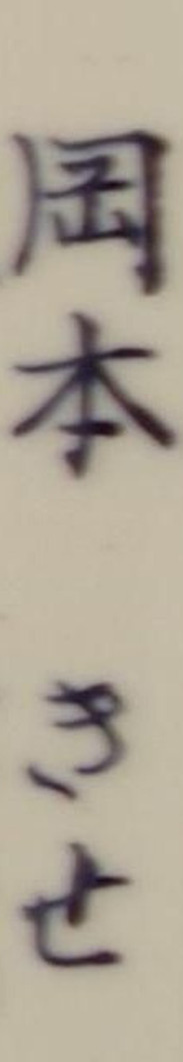岡本きせ
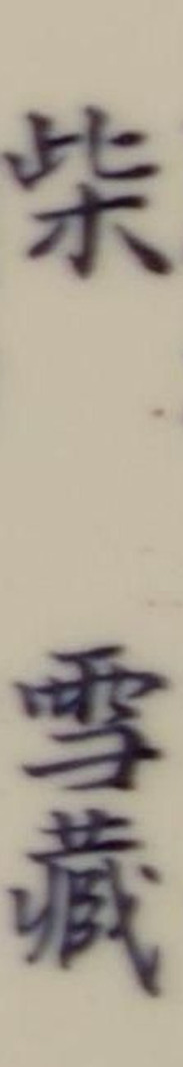柴雪蔵
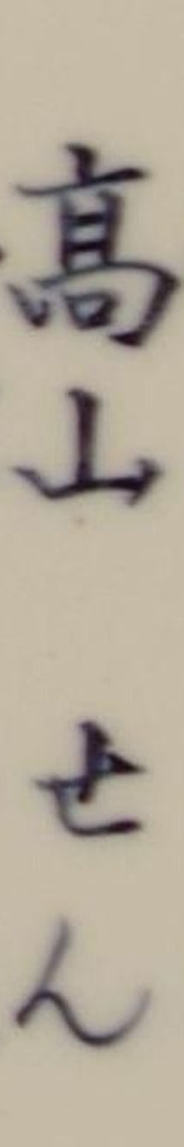高山せん
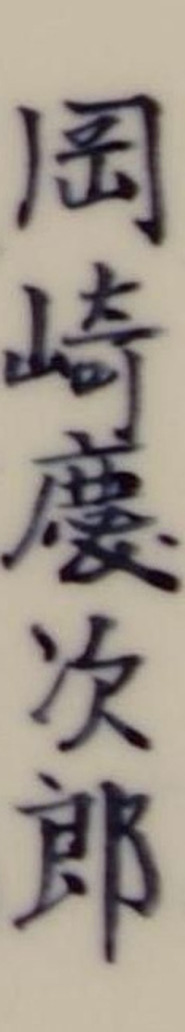岡崎慶次郎
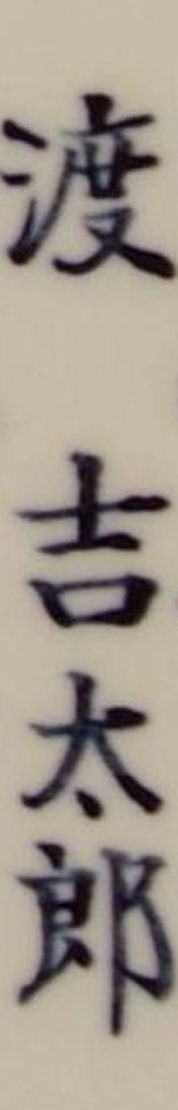渡吉太郎
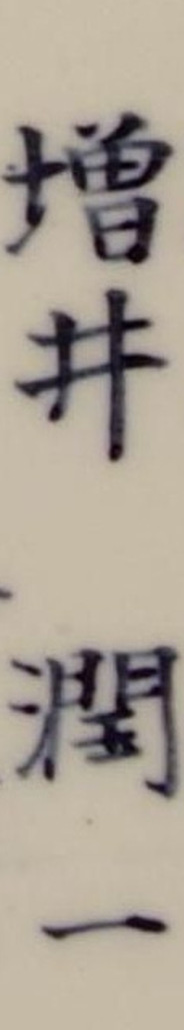増井潤一
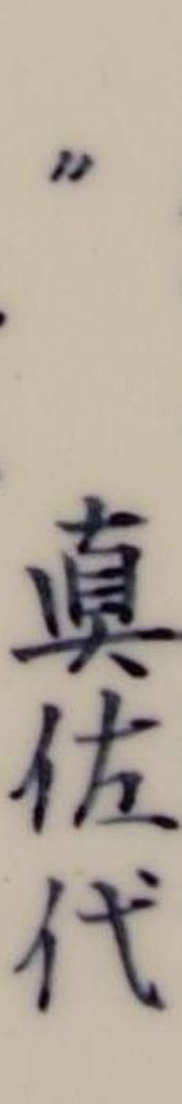真佐代
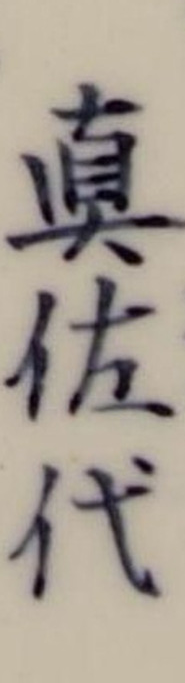真佐代
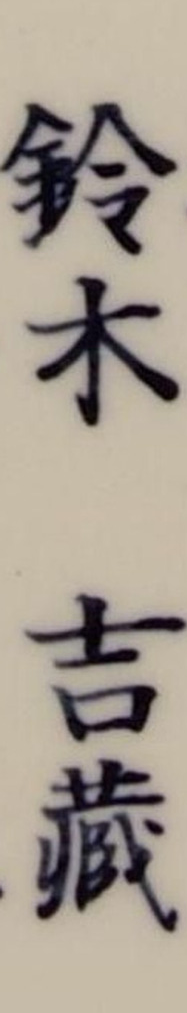鈴木吉蔵
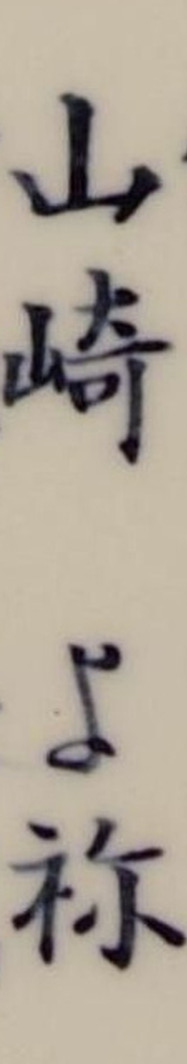山崎よね
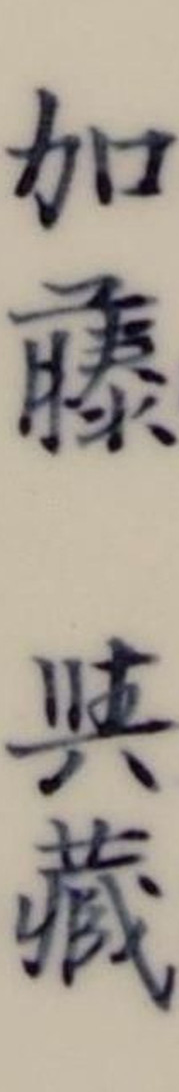加藤与蔵
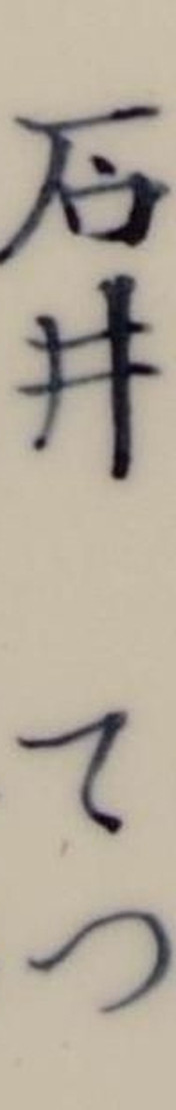石井てつ
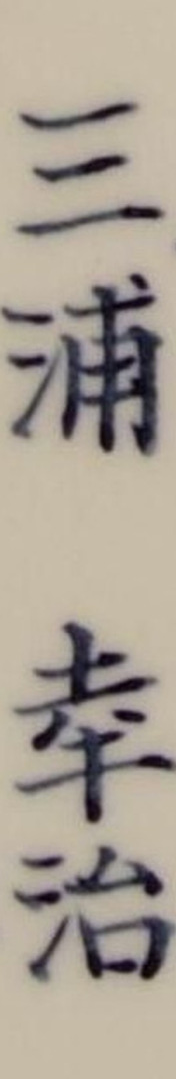三浦幸治
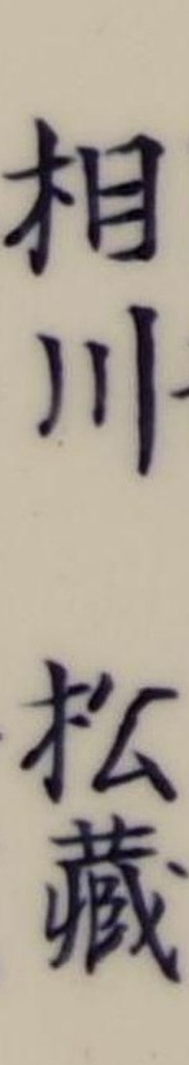相川松蔵
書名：M~S
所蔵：高野山金剛峯寺
